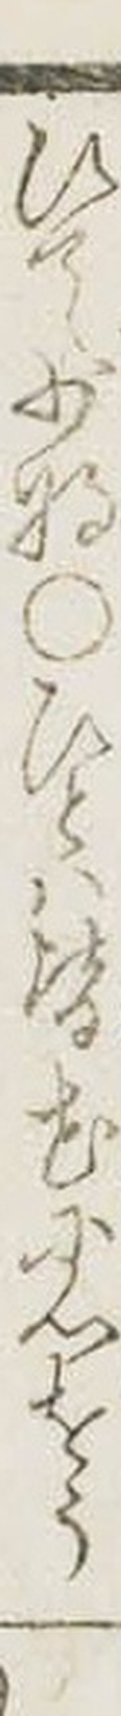ひて少将○ひとは皆花に心をう
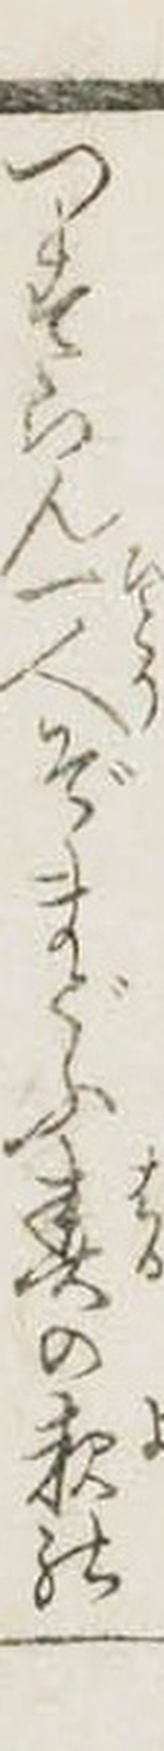つすらん一人ぞまどふ春の夜の
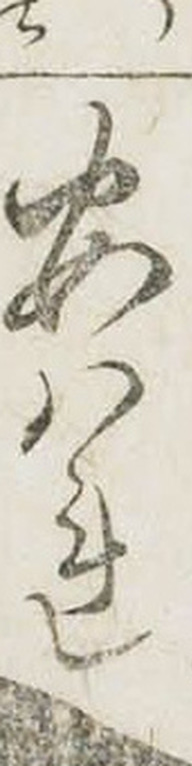あはれ
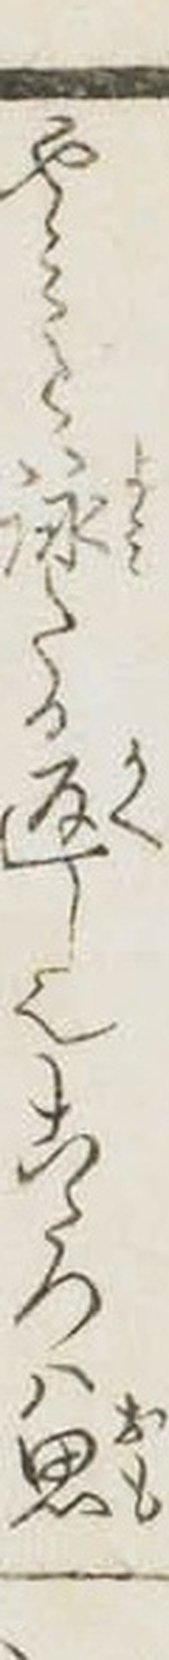やみと詠たる返し也ころは思
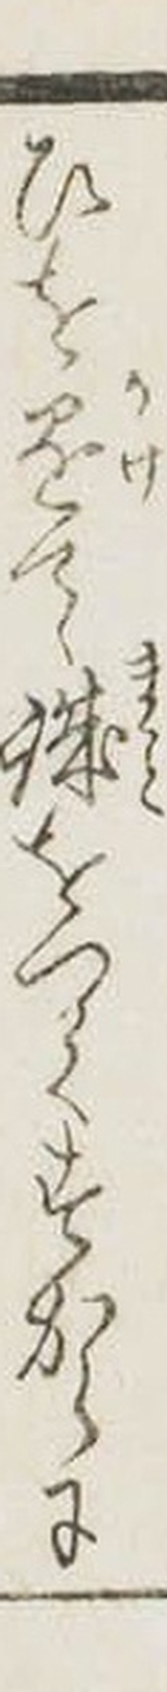ひを懸て誠をつくすからに
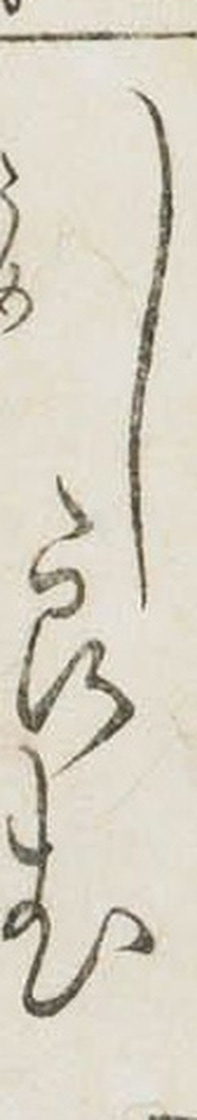しらむ
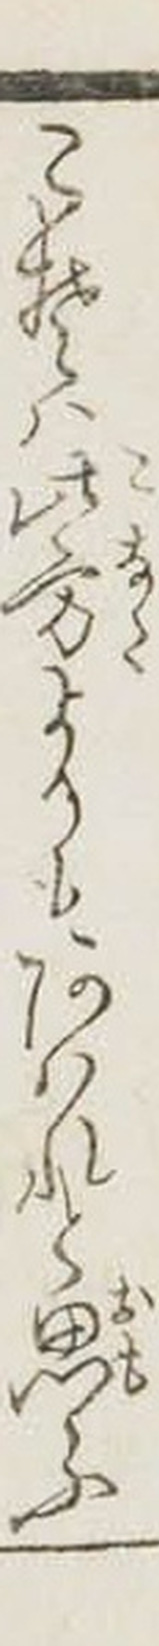こそは此方よりもあはれと思ふ
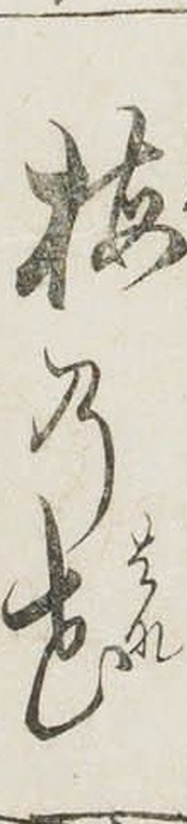梅の花
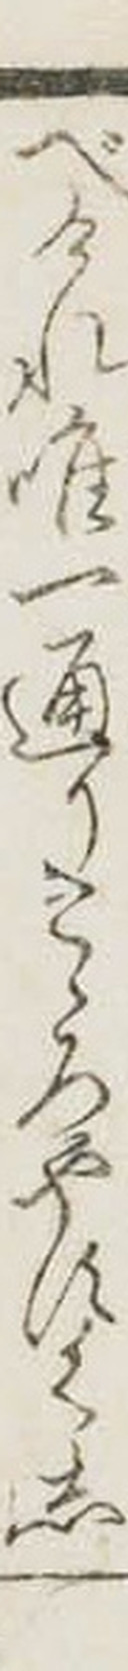べけれ唯一通りこゝろやすくし
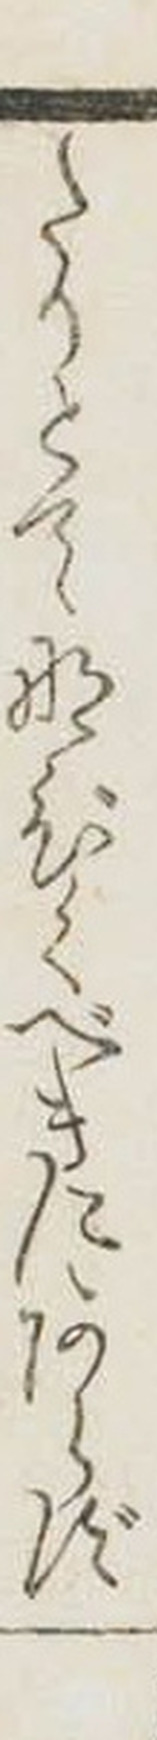たりとてなびくべきにあらず
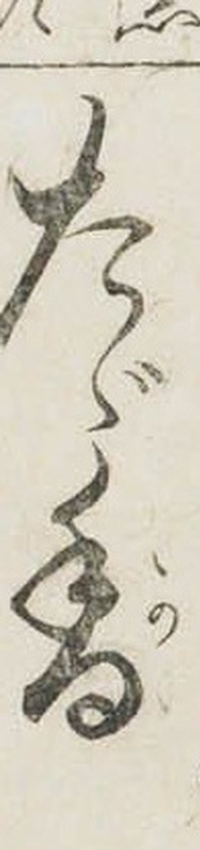たゞ香
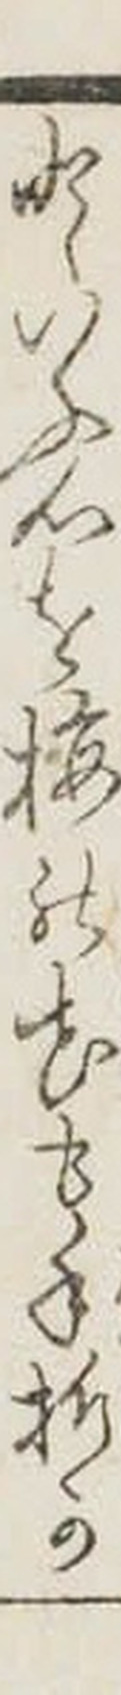といふ心を梅の花も手折か
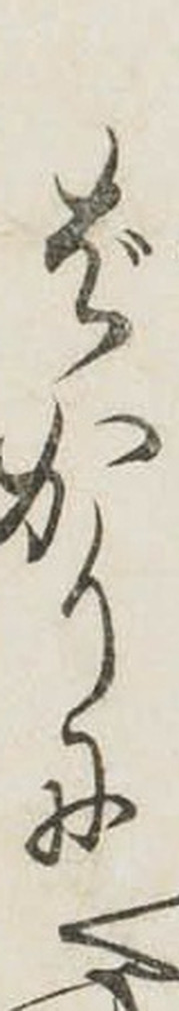ばかりに
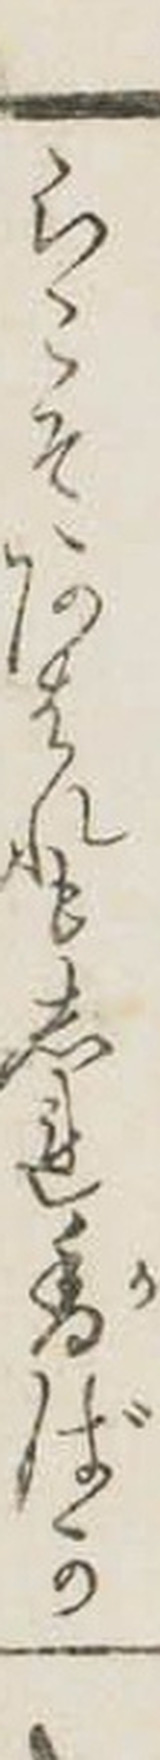らこそあはれもしれ香ばか
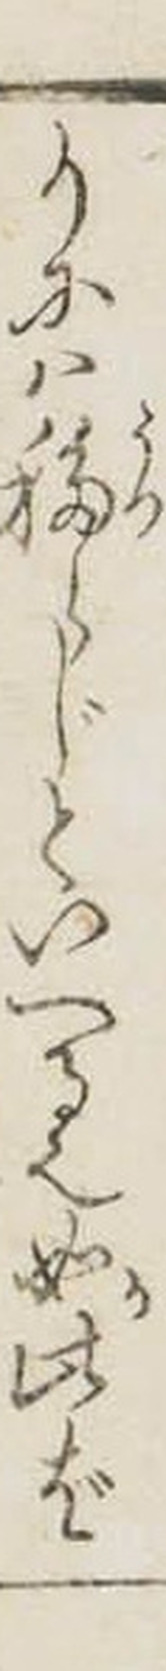りには移らじといへる也如此ば
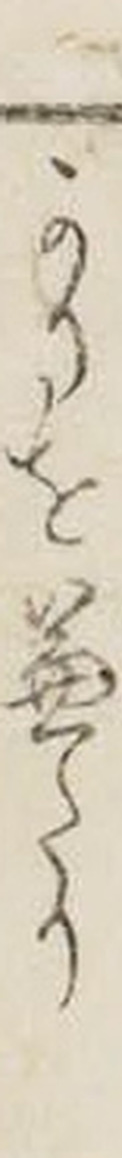かりを兼たり
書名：源氏百人一首
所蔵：東京学芸大学教育コンテンツアーカイブ
